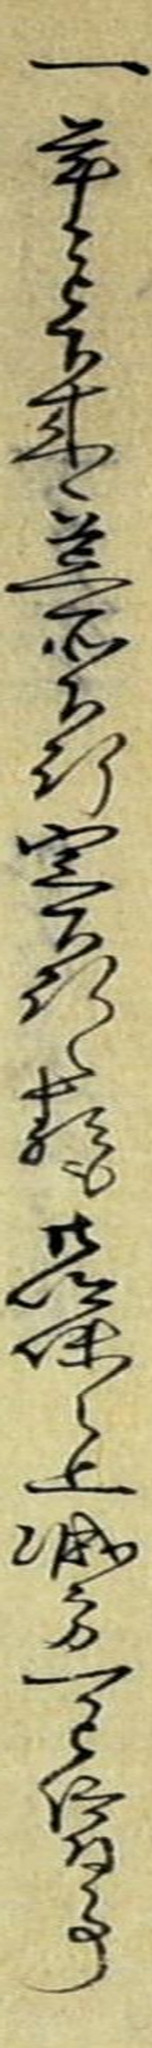一年々被下来候荒所下行定下行之類も御吟味之上減方可被仰付事
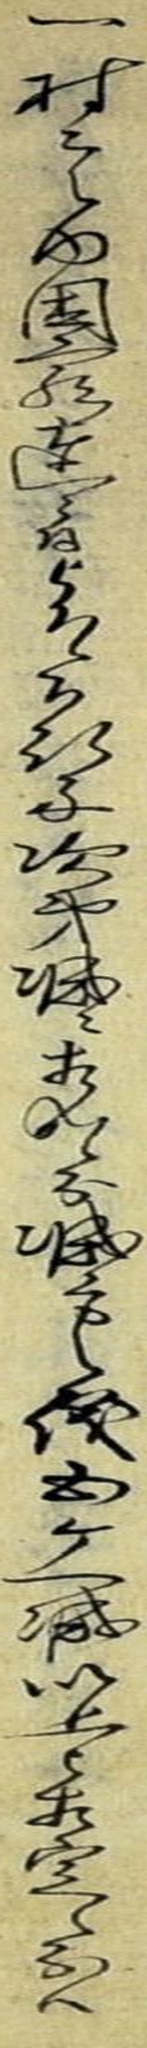一村々之内困窮達ニ付被下候下行米次第減ニ相成候分減方之儀五ケ一減以上被相定候分ハ
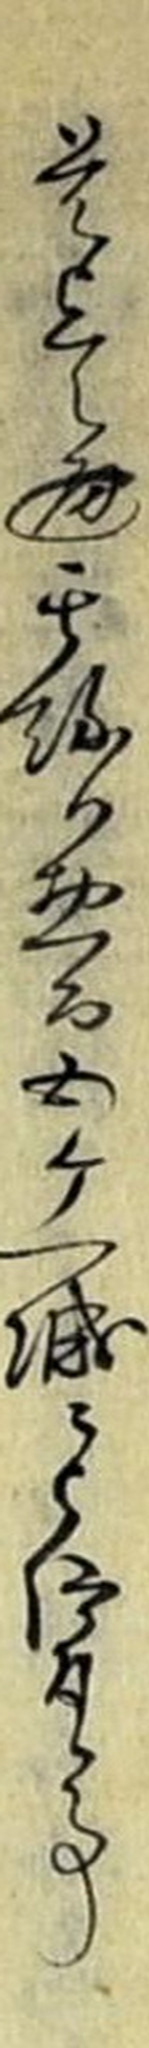是迄之通其余ハ惣而五ケ一減ニ被仰付候事
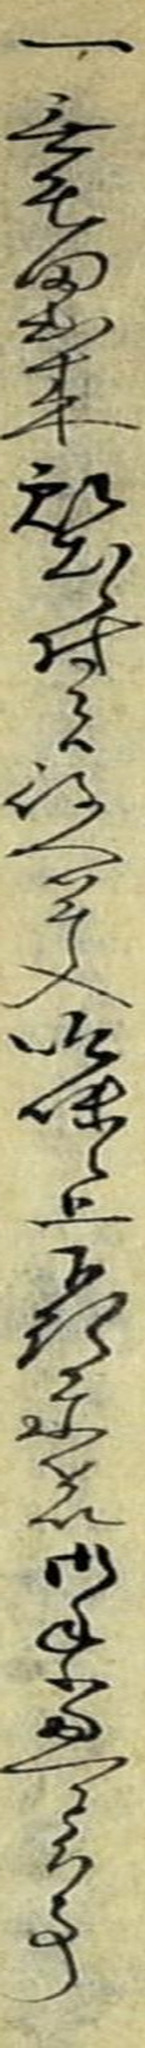一無毛田出来願出候村々ハ役人竿入吟味之上下行米を以御手当可被下事
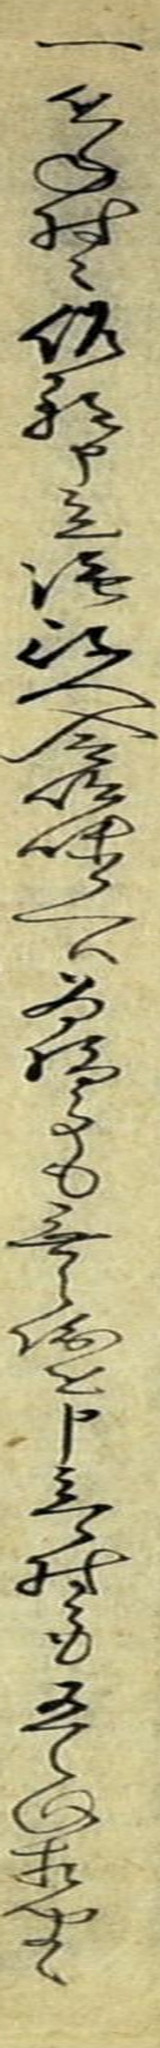一近年村々作難申立強役人令吟味候ヘハ為指事も無之儀を申立候村々も有之趣相聞候
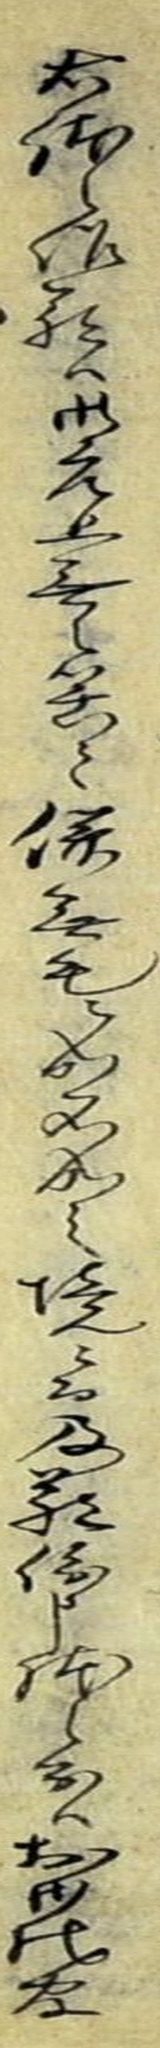右体之作難ハ御取上無之筈ニ候併無毛ニ成不成之境ニ而及難儀申体之義ハ
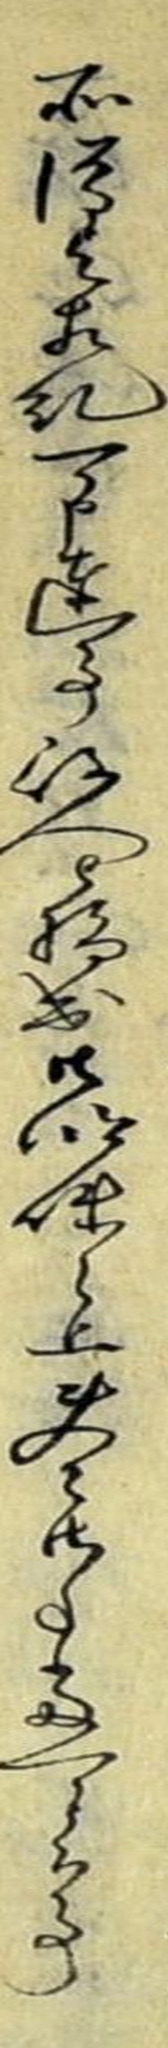所得与相糺可申達事役人被指出御吟味之上夫々御手当可被下事
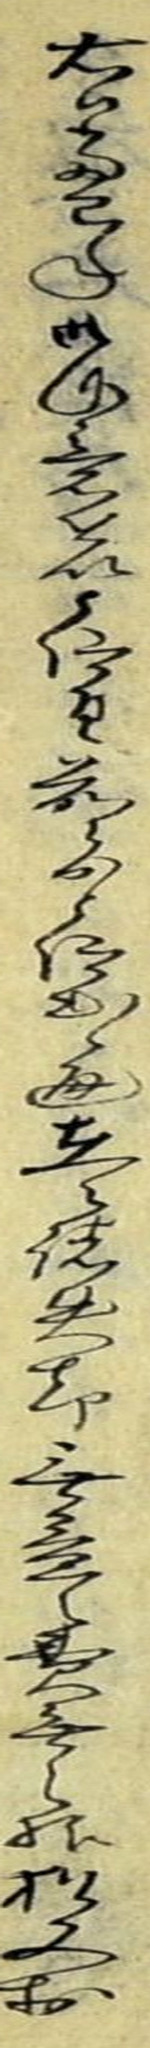右ハ当巳年御趣意を以被仰付候前々ゟ被仰出候通在々諸失却無益之費無之様猶又於
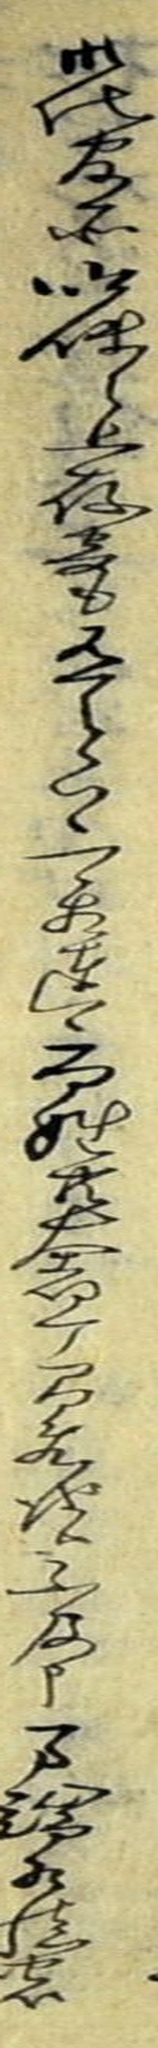御代官所吟味之上存寄も有之候ハヽ可相達候百姓共奢ケ間敷儀ハ不及申万端相慎農
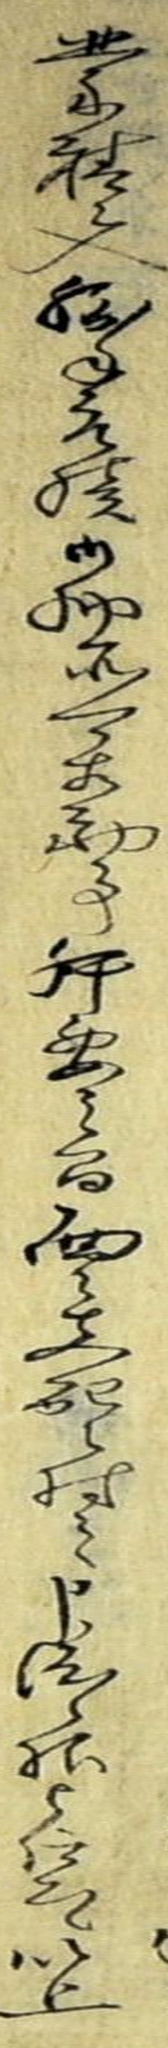業精ニ入勝手取続御納所可相勤事肝要ニ候間面々支配之村々へ申渡候様被仰出候以上
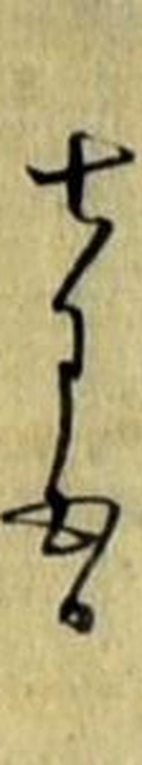七月五日

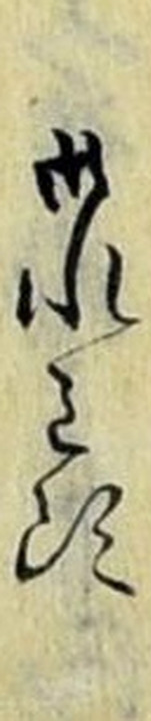御水主頭
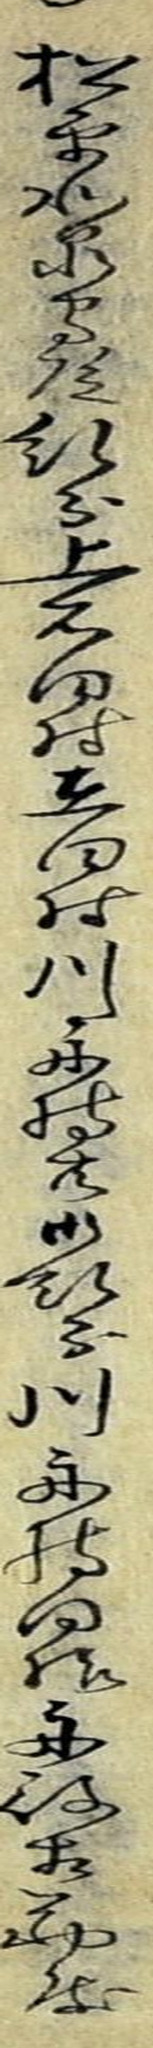〇松平和泉守殿領分上石田村在田村川舟持共御領分川舟持同様舟役相勤度
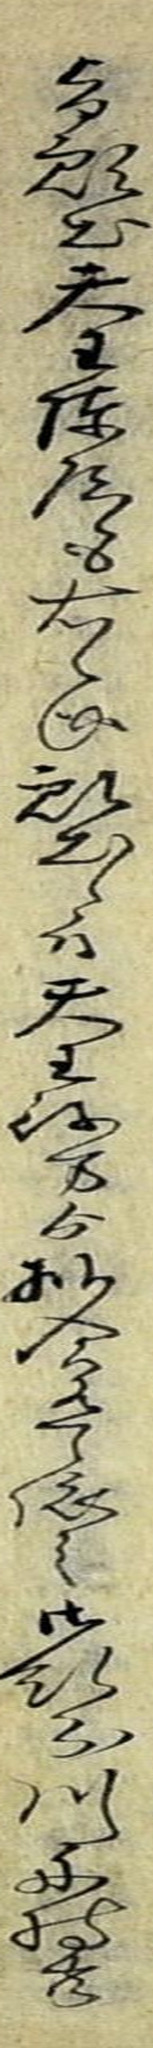旨願出天王陣屋へも右之趣願出候ニ付天王役方ゟ掛合有之依之御領分川舟持共
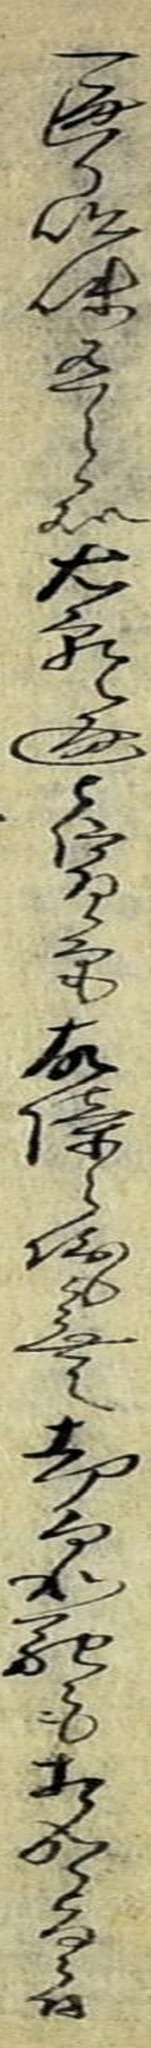一通り吟味有之候処右願之通被仰付候而も故障之儀も無之却而和ニも相成候旨ニ付
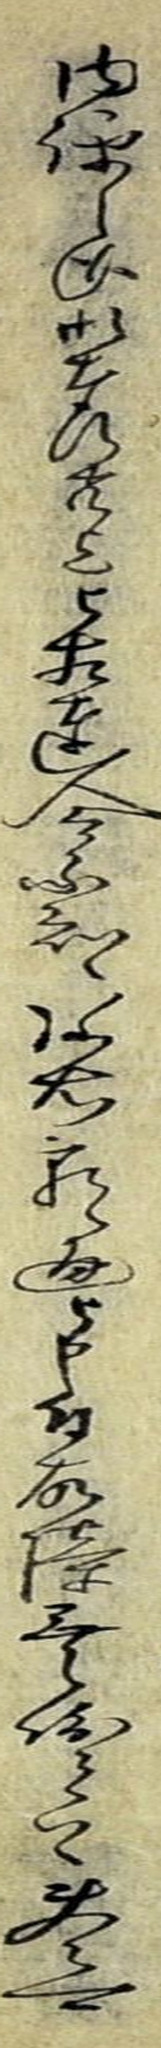内許之趣御奉行共迄被相達令承知候弥右願之通被申付故障無之儀ニ候ハヽ夫々可
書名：命令之部 三
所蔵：福井県文書館 Fukui Prefectural Archives
